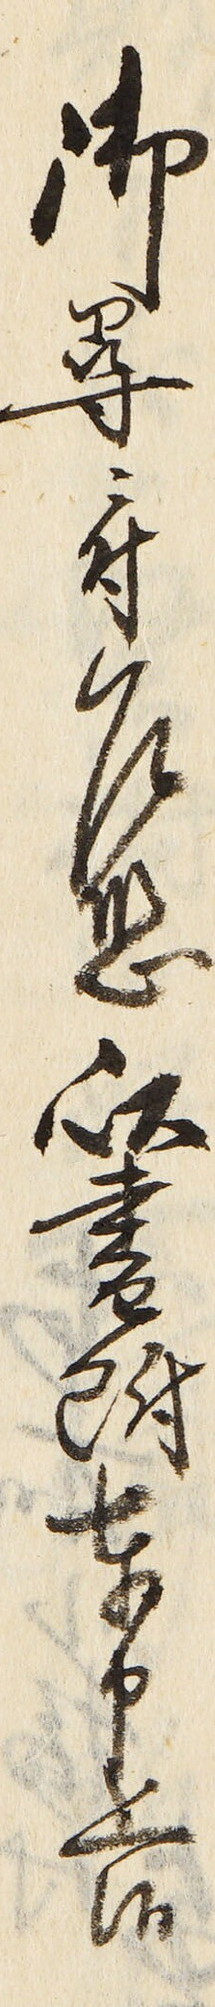御尋に付乍恐以書附奉申上候
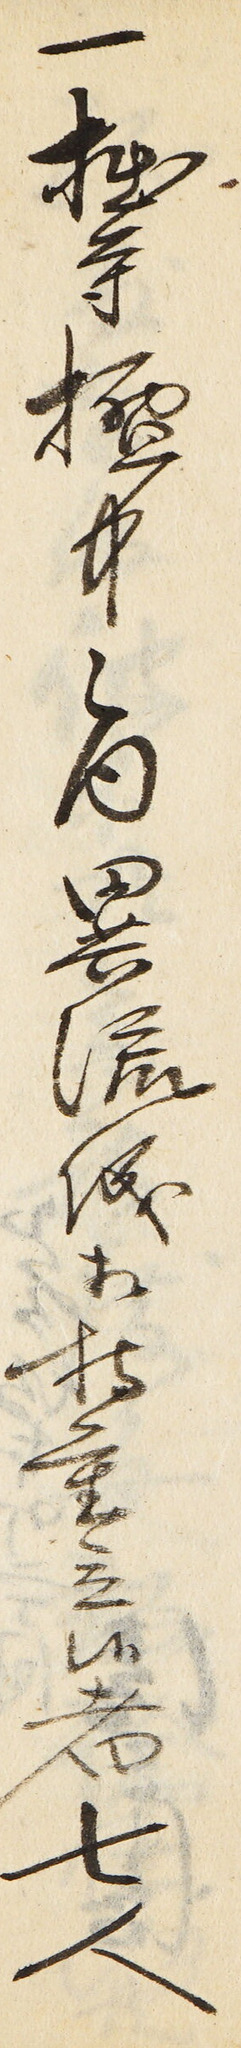一拙寺檀中之内異流儀相持重立候者七人
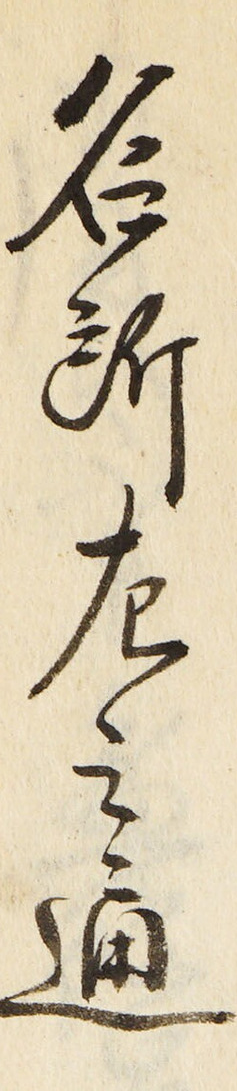名所左之通
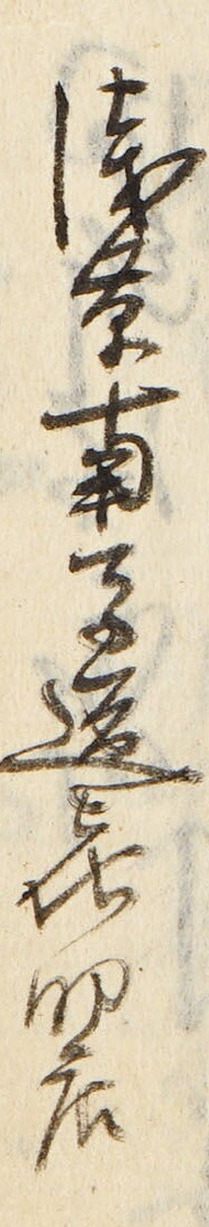浅草南馬道喜助店
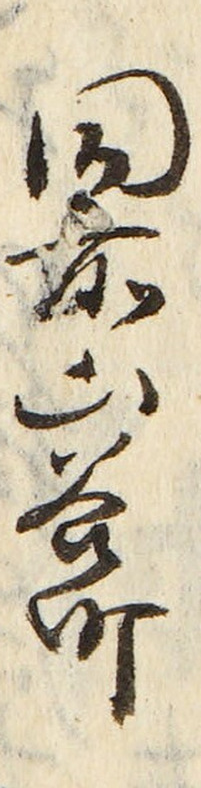同所山谷町

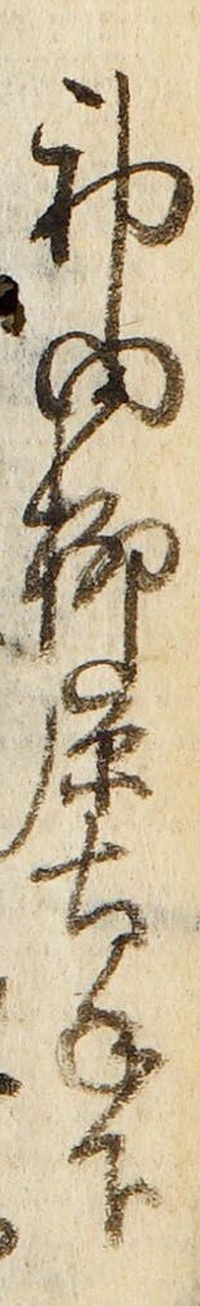神田柳原土手下
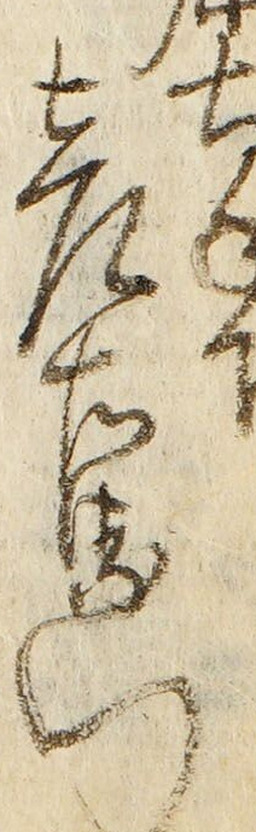彦右衛門
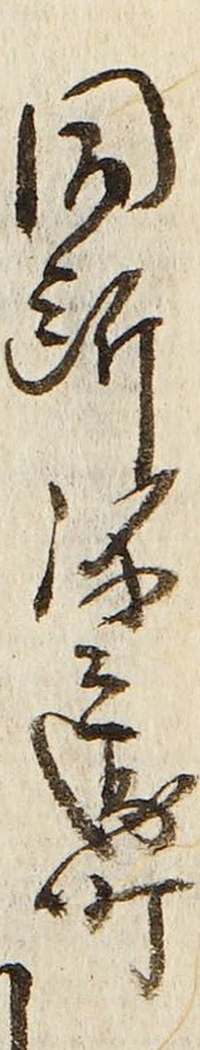同所弥兵衛町
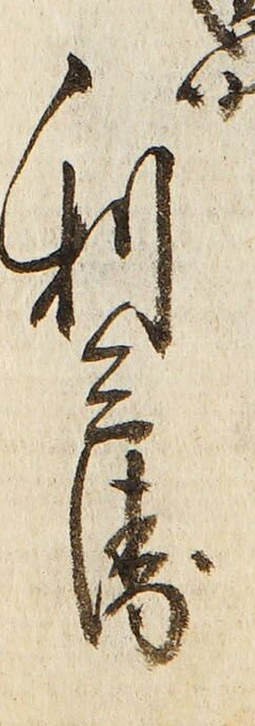利兵衛
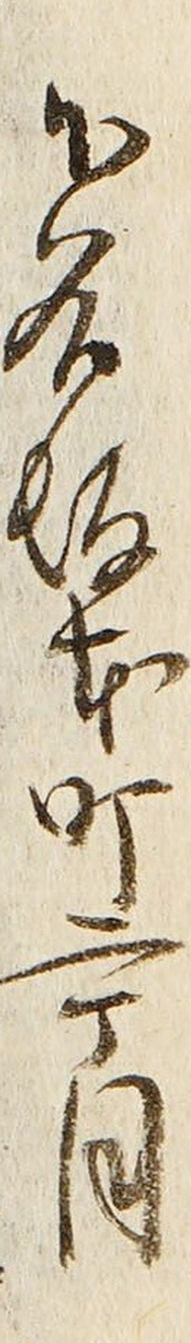下谷坂本町二丁目
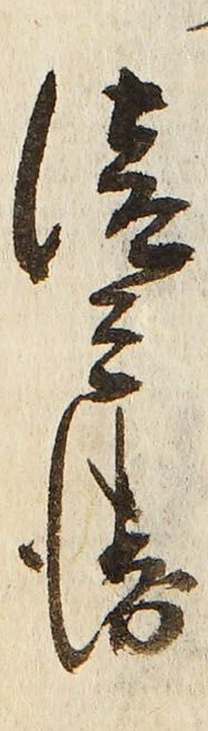清兵衛
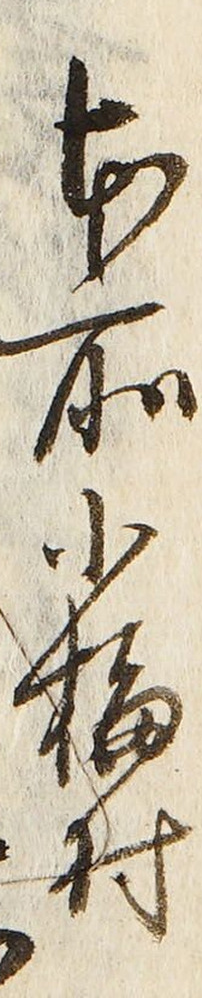本所小梅村
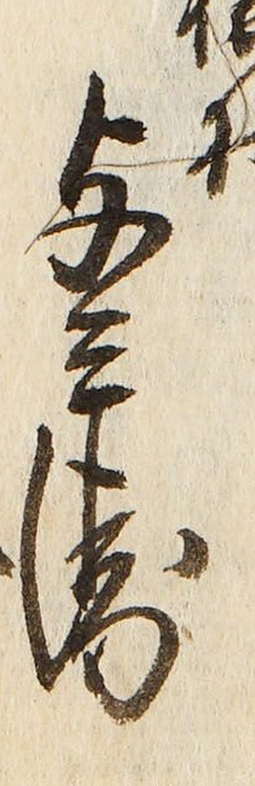与兵衛
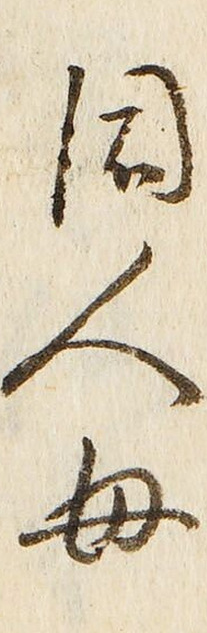同人母
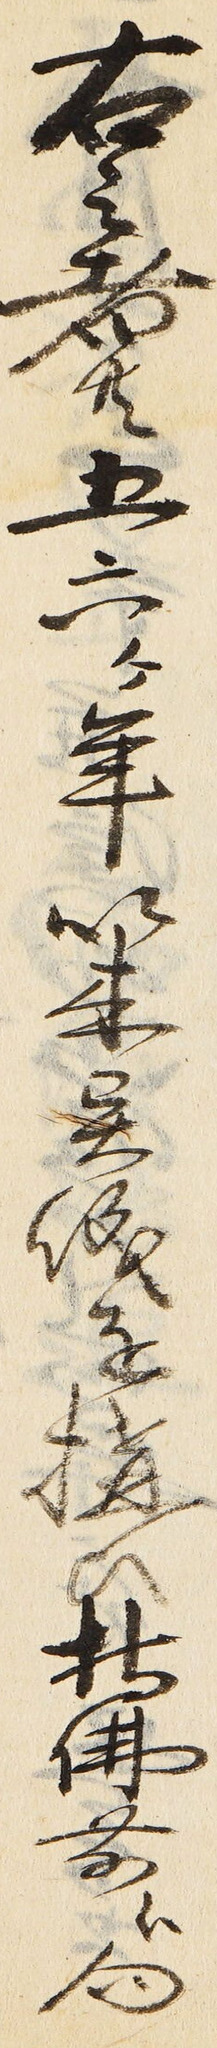右之者共五六ケ年以来異儀を構ひ持仏前江向
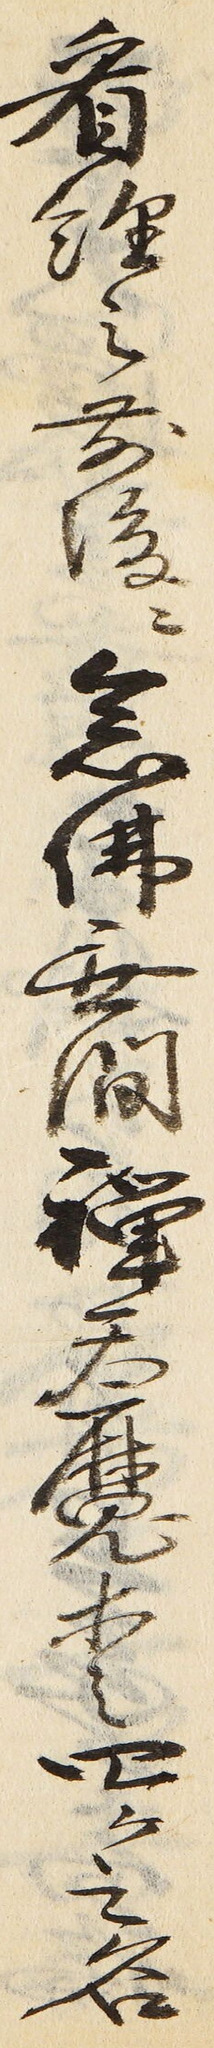看経之前後に念佛無間禅天魔等之四ケ之名
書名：異流一件日記
